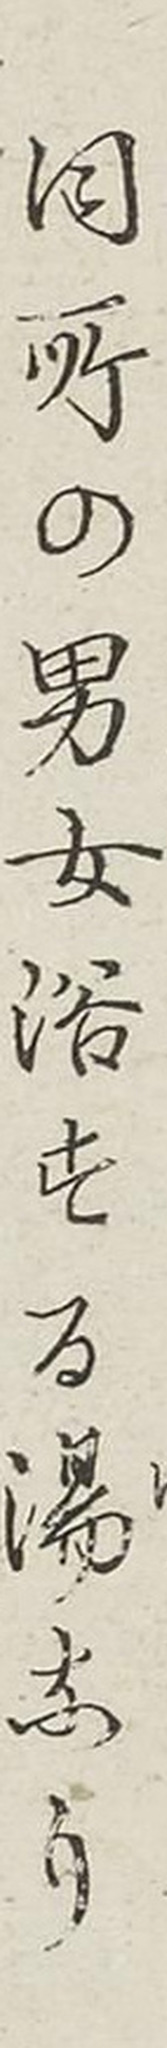同所の男女浴する湯なり
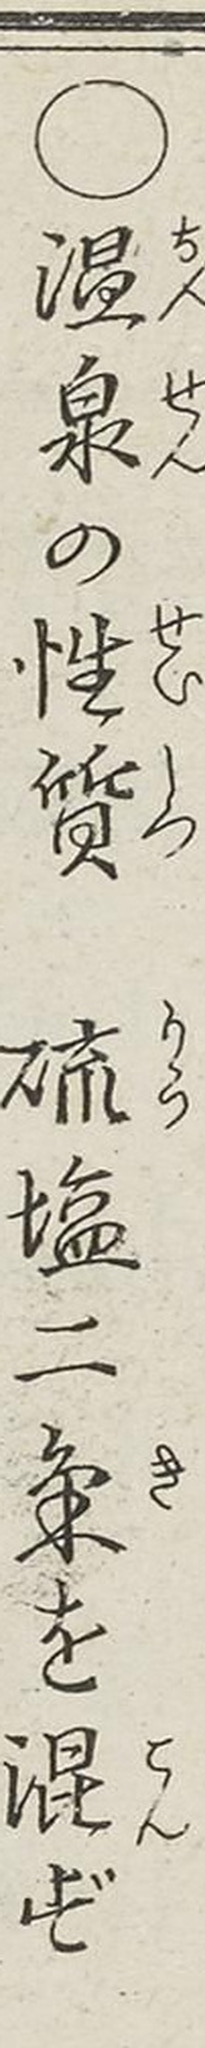○温泉の性質硫塩二氣を混ず
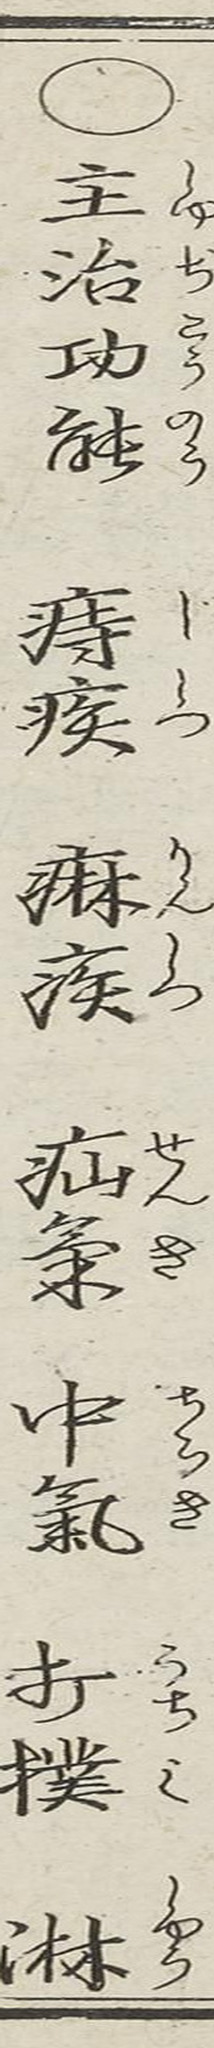○主治功能痔疾痳疾疝氣中氣打撲淋
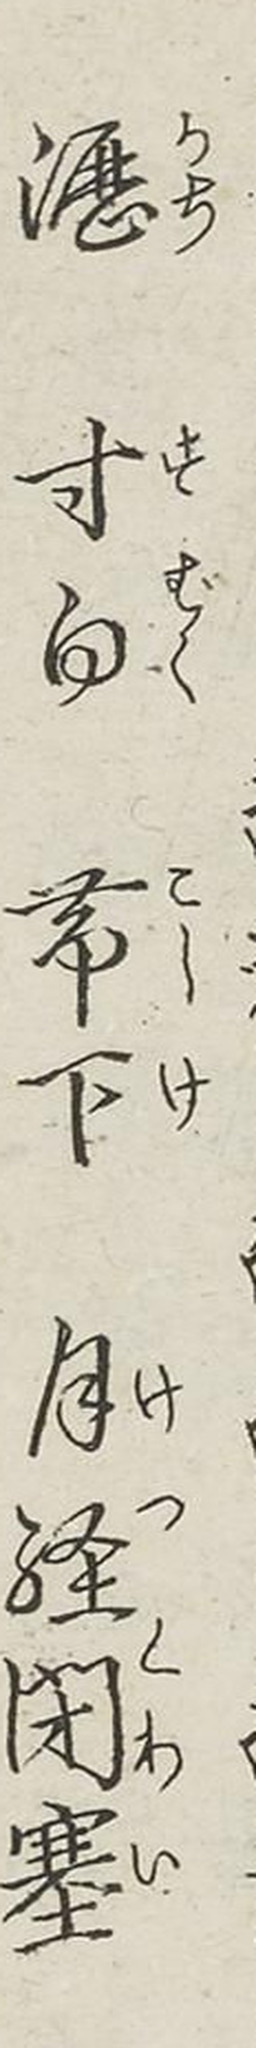瀝寸白帯下月経閉塞
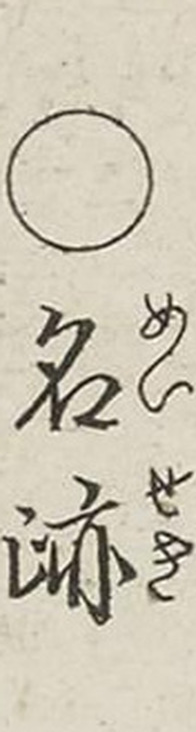○名跡
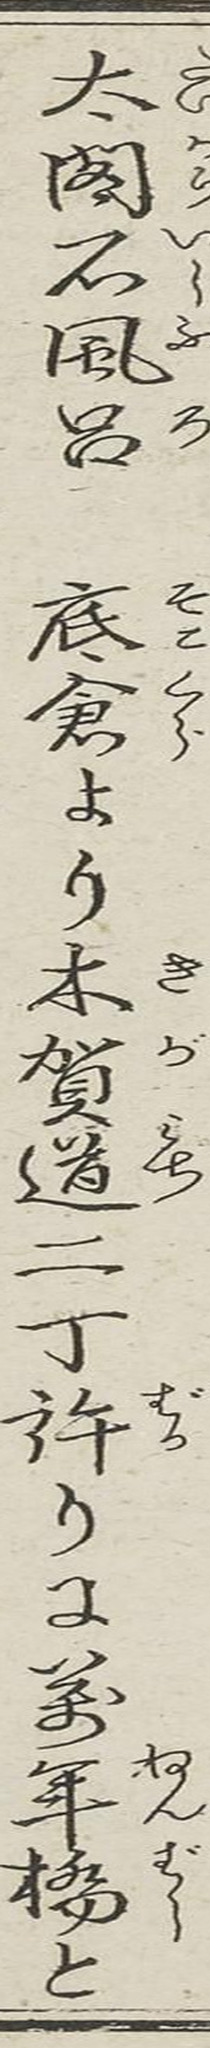太閤石風呂底倉より木賀道二丁許りに萬年橋と
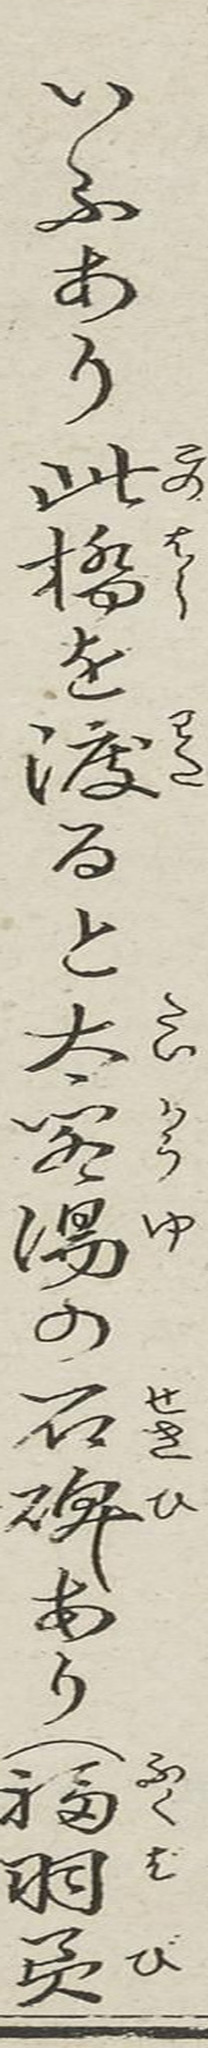いふあり此橋を渡ると太閤湯の石碑あり
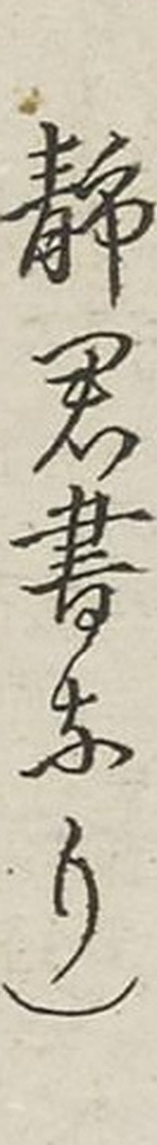静君書なり）
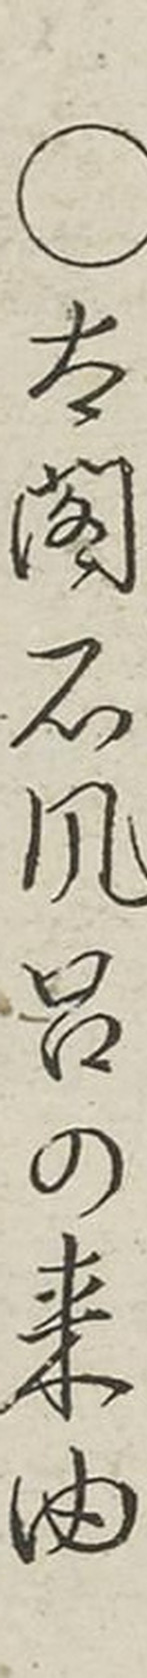○太閤石風呂の来由

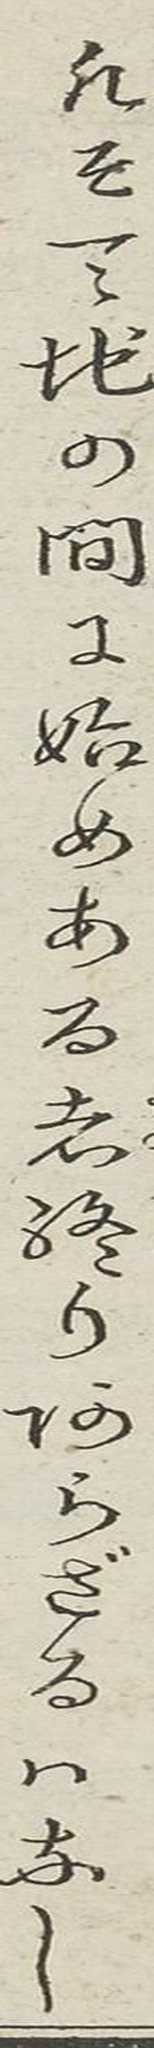凡そ天地の間に始めある者終りあらざるはなし
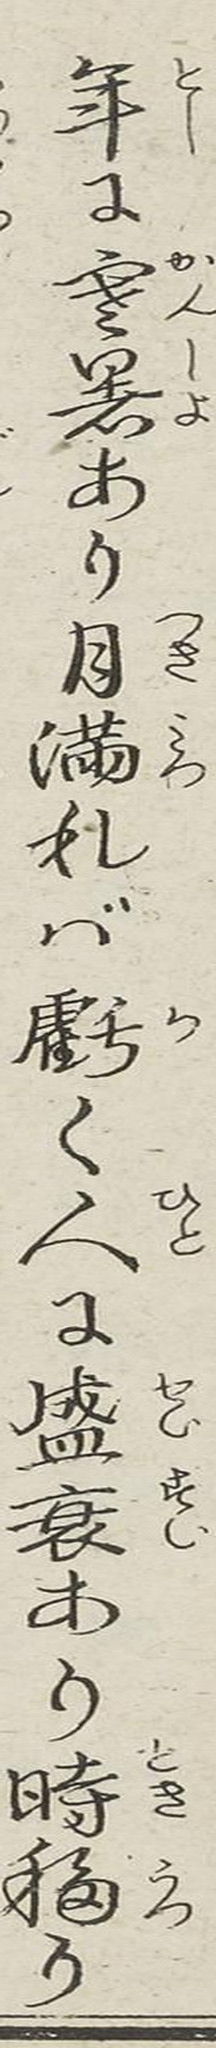年に寒暑あり月満れば虧く人に盛衰あり時移り
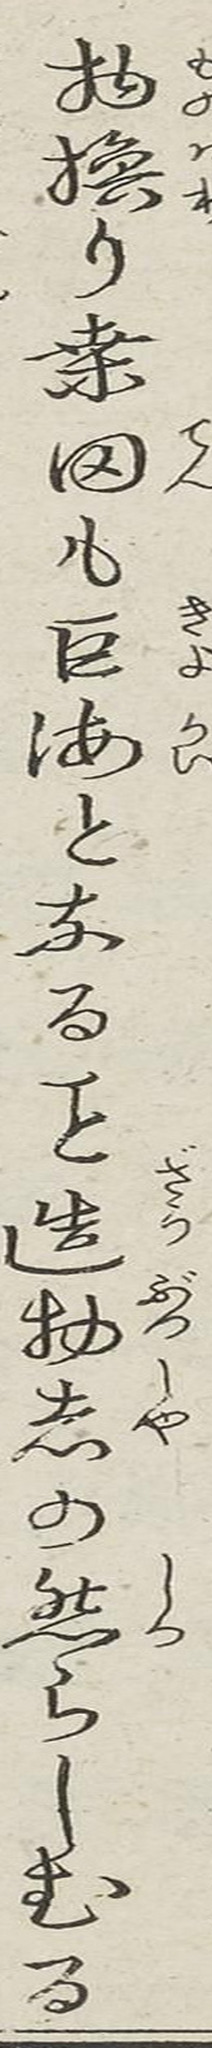物換り桑田も巨海となるを造物者の然らしむる
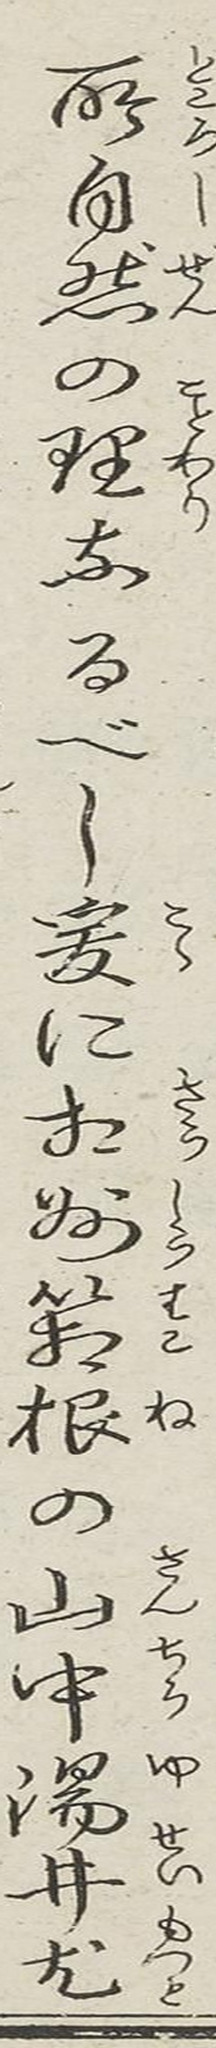所自然の理なるべし爰に相州箱根の山中湯井尤
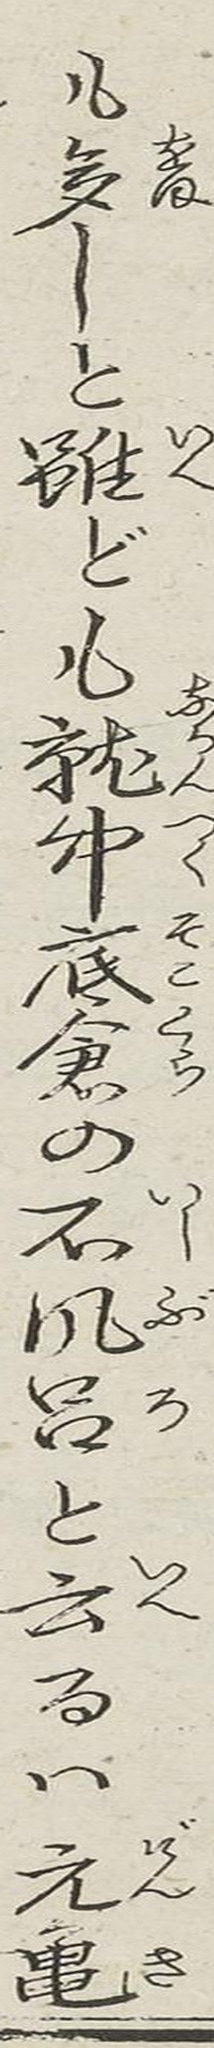も多しと雖ども就中底倉の石風呂と云るは元亀
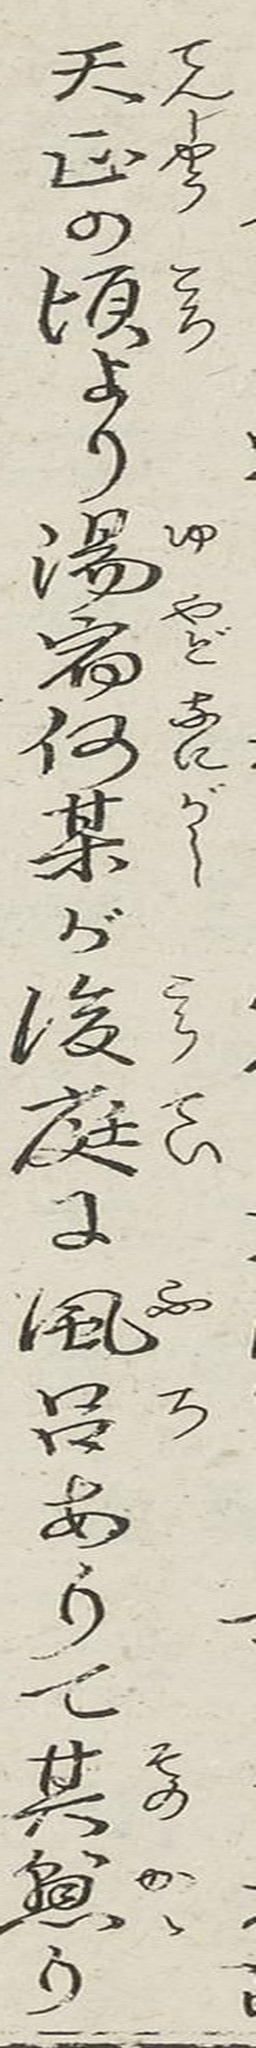天正の頃より湯宿何某が後庭に風呂ありて其懸り
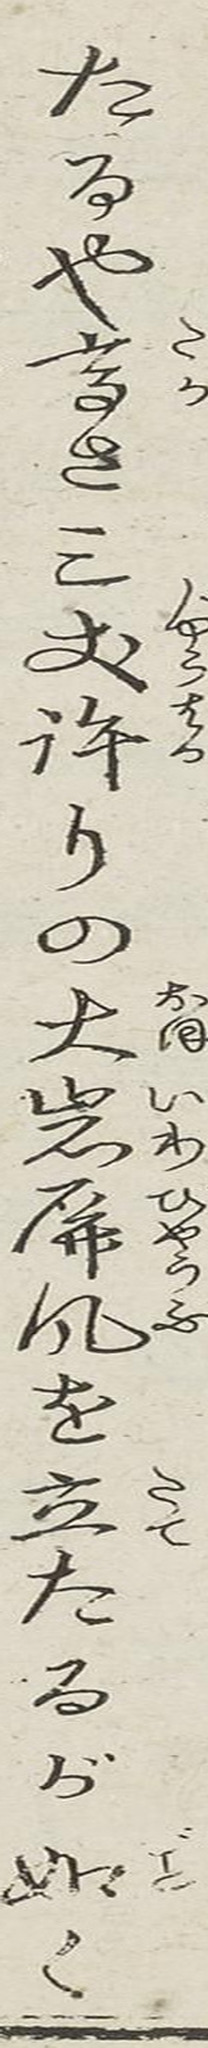たるや高さ三丈許りの大岩屏風を立たるが如く
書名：箱根温泉誌　全
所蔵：東京大学地震研究所図書室 Earthquake Research Institute Library, The University of Tokyo, JAPAN
